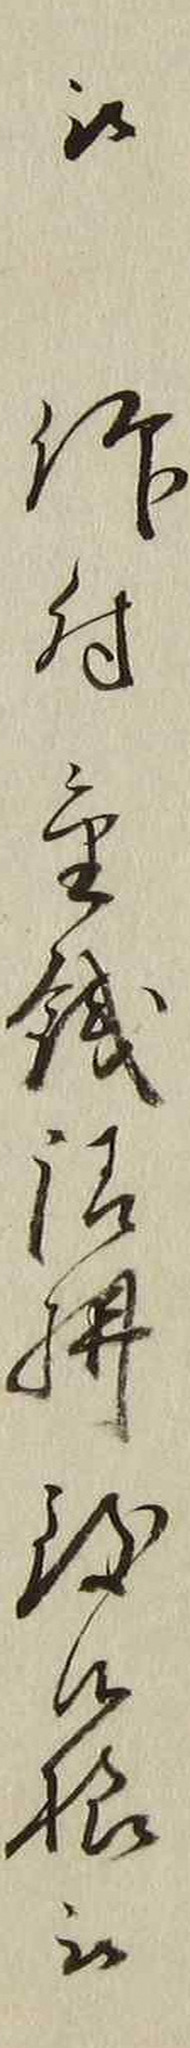被仰付金銭請払致候様被
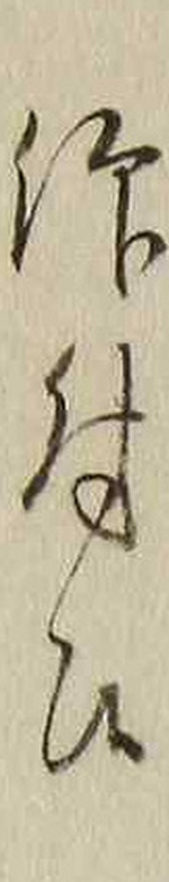仰付候
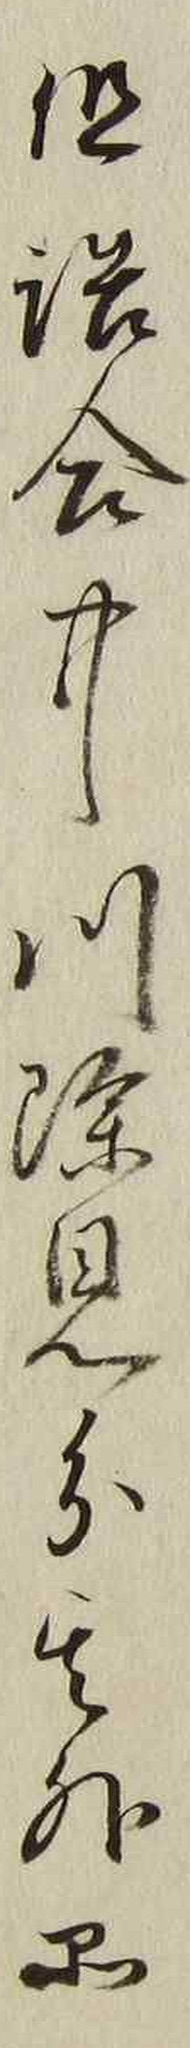但詰合中川除見分其外品
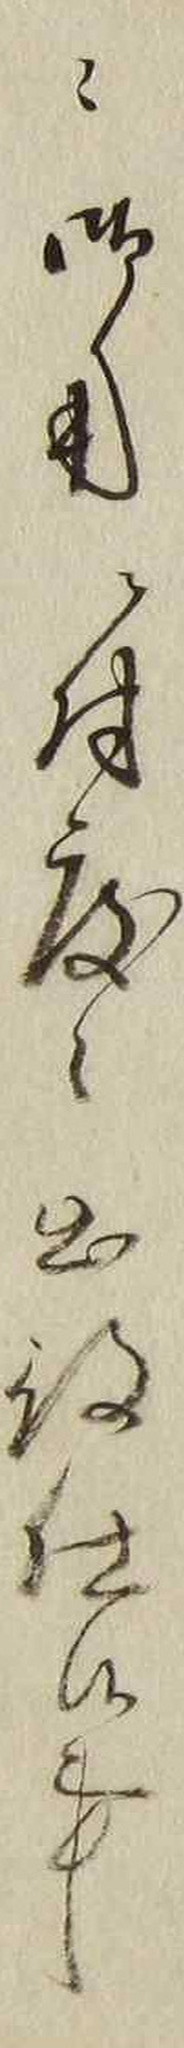々御用ニ付度々出役仕候事
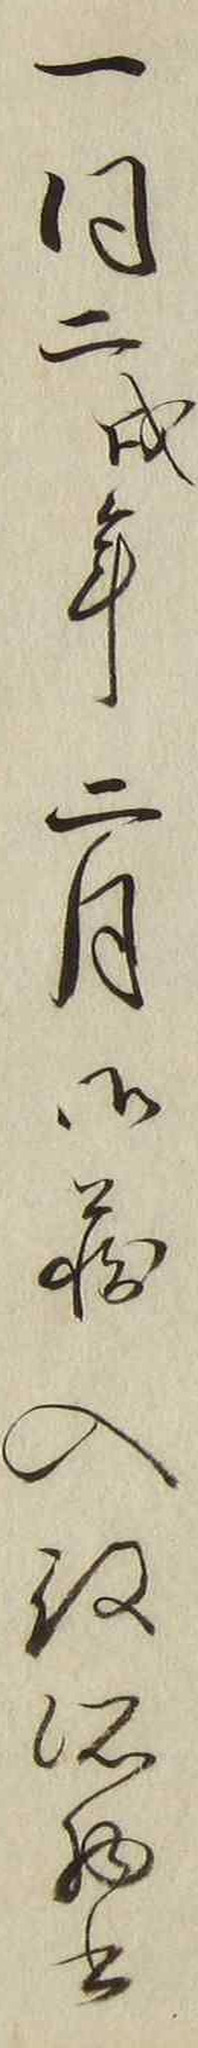一同二戌年二月御蔵入役所物書

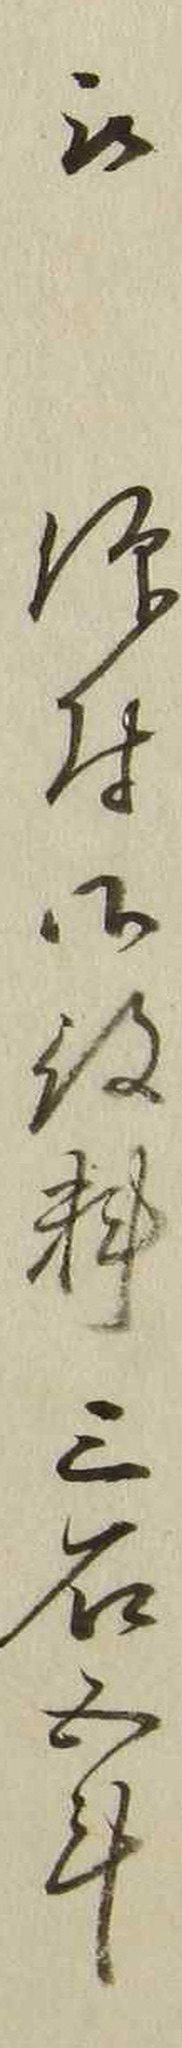被仰付御役料三石五斗
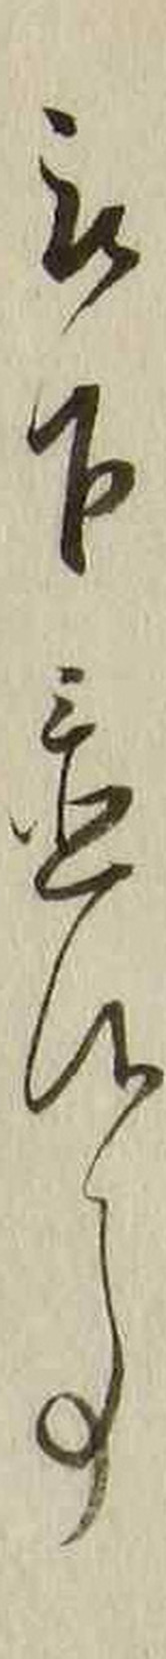被下置候事
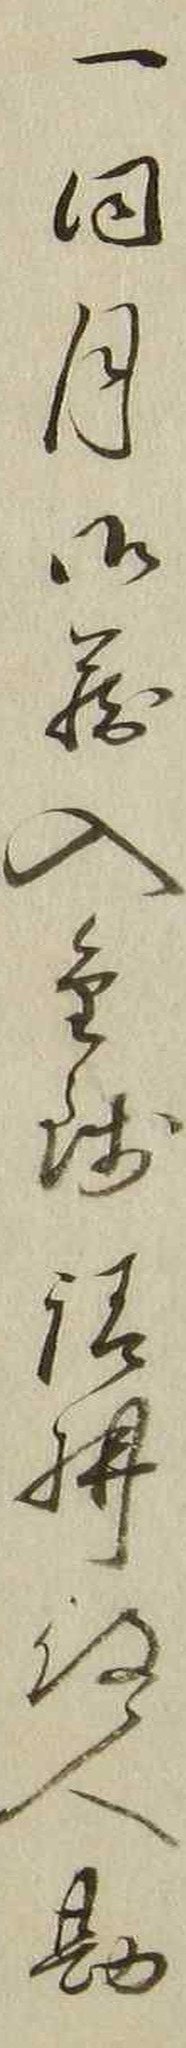一同月御蔵入金銭請払役人勘
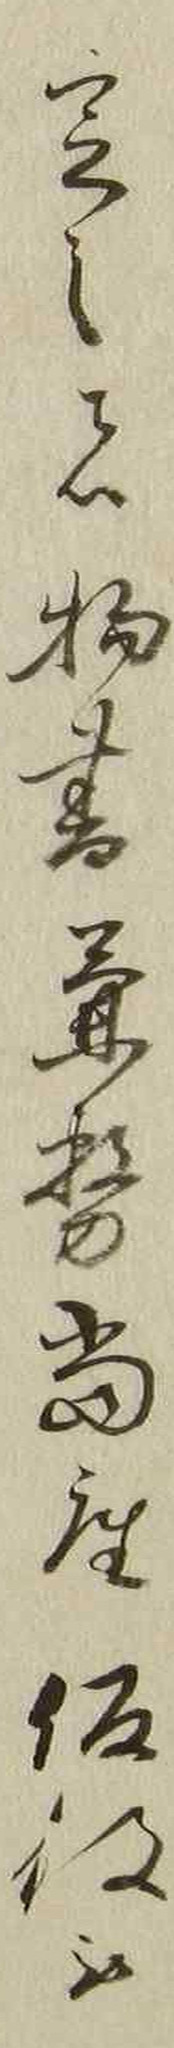定之者物書兼務当座仮役被
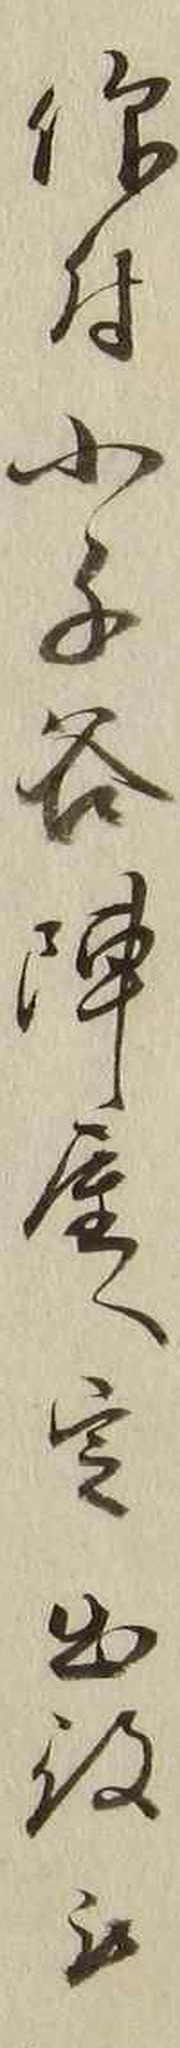仰付小千谷陣屋へ定出役被
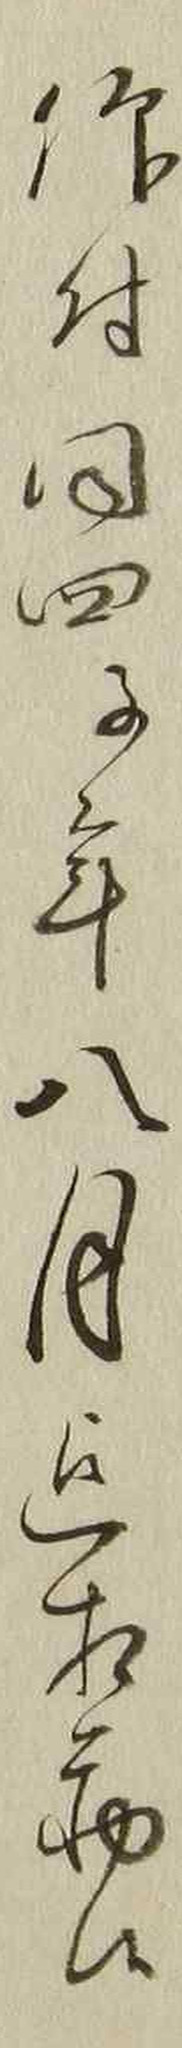仰付同四子年八月迄相勤候
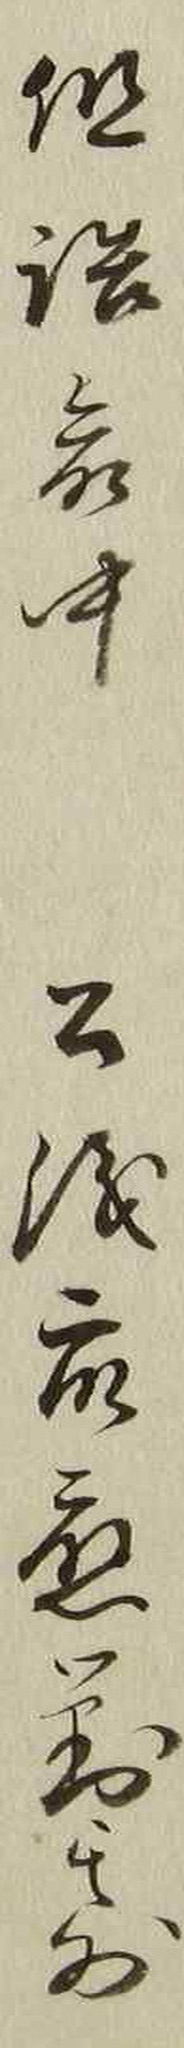但詰衆中公儀衆応対其外
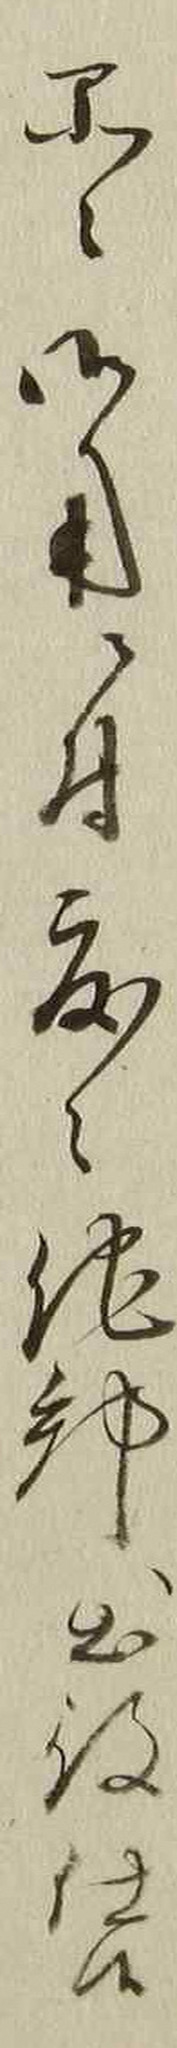品々御用ニ付度々他邦へ出役仕候
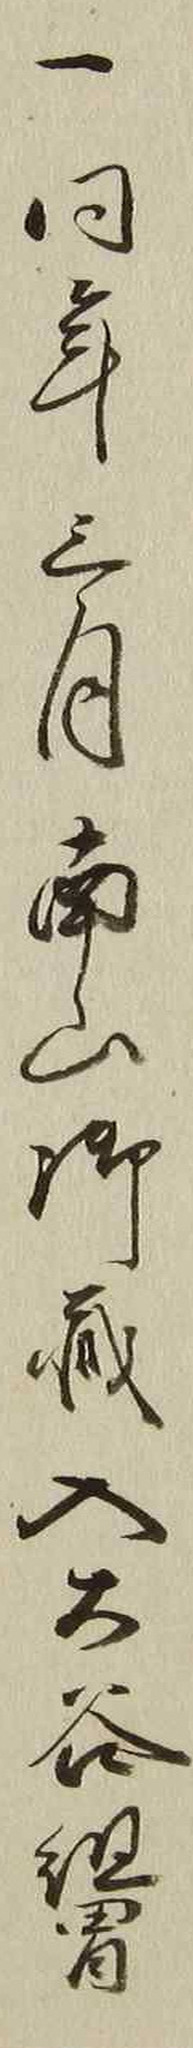一同年三月南山御蔵入大谷組胃
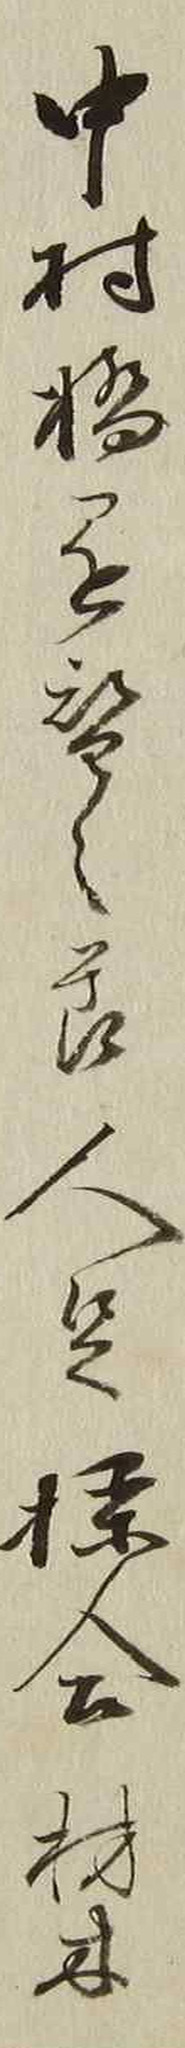中村橋懸替之節人足操合材木
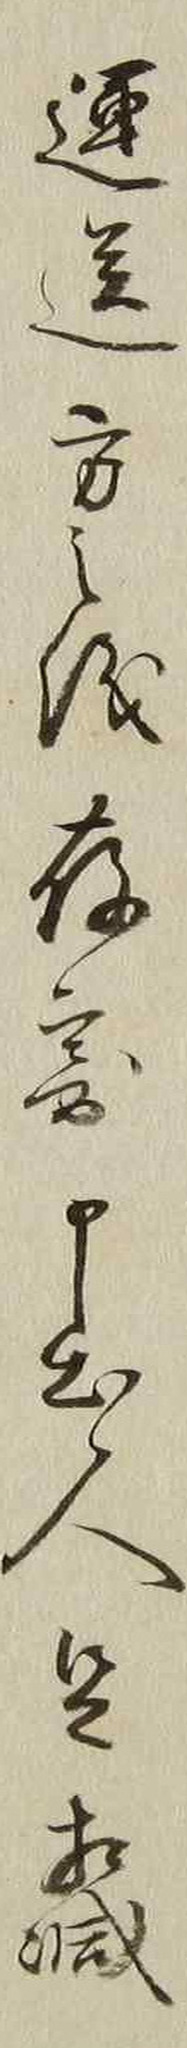運送方之儀存寄申出人足相減
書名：諸士系譜　巻之52　に之部3
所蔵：会津若松市立会津図書館
